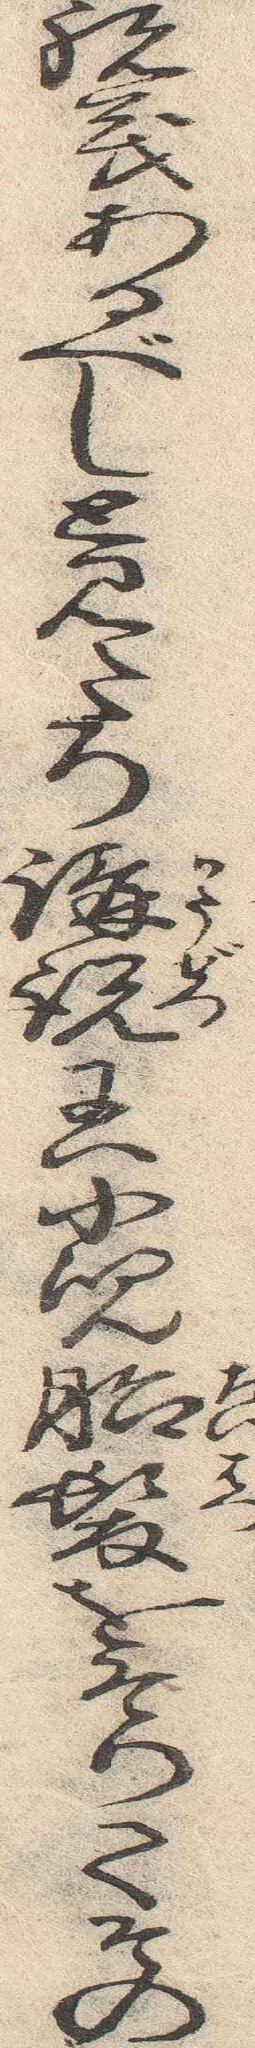祝義あるべしと見えたり講説には小児胎髪をそりてその
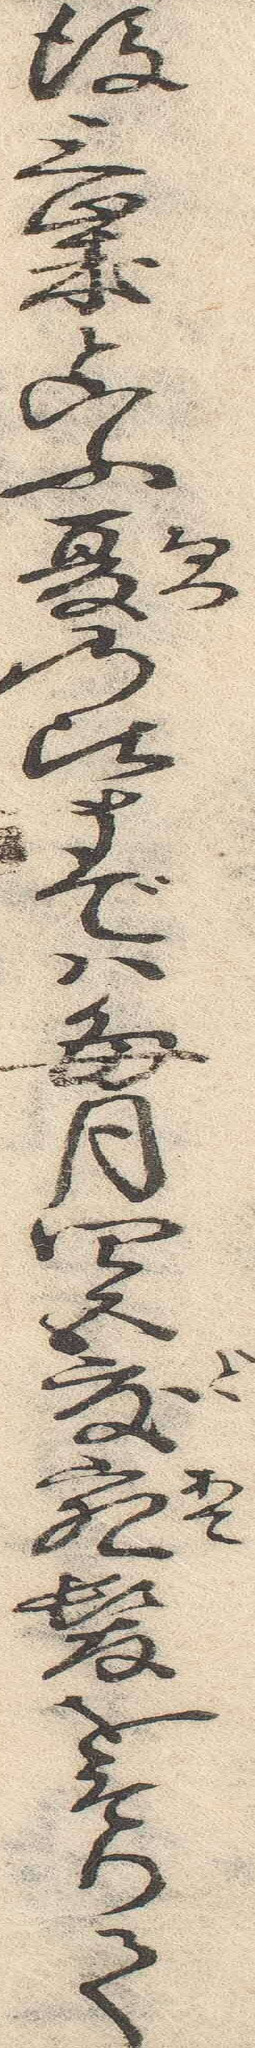後三四歳といふ夏の比までは毎月四五度宛髪をそりて
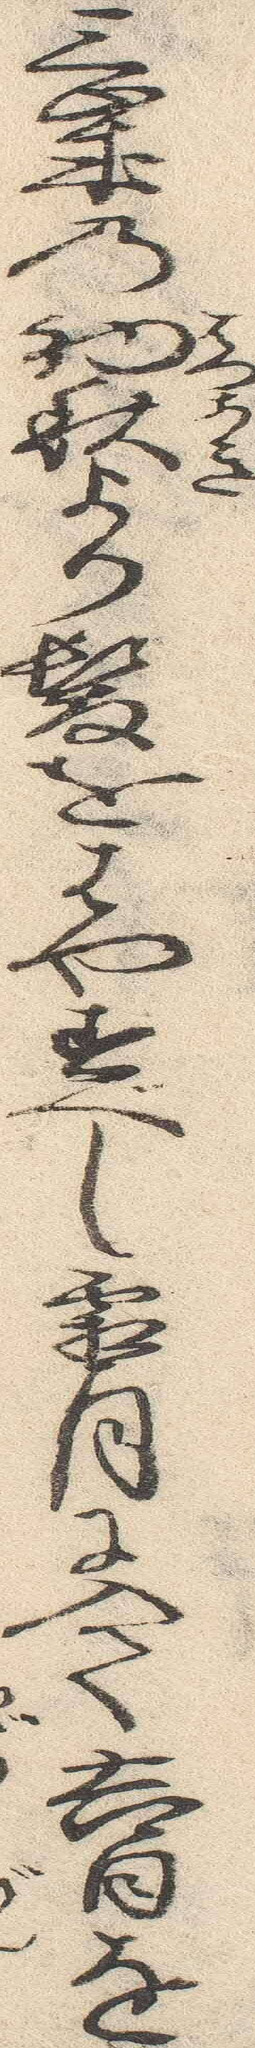三四歳の初秋より髪をはやすべし霜月に入て吉日を
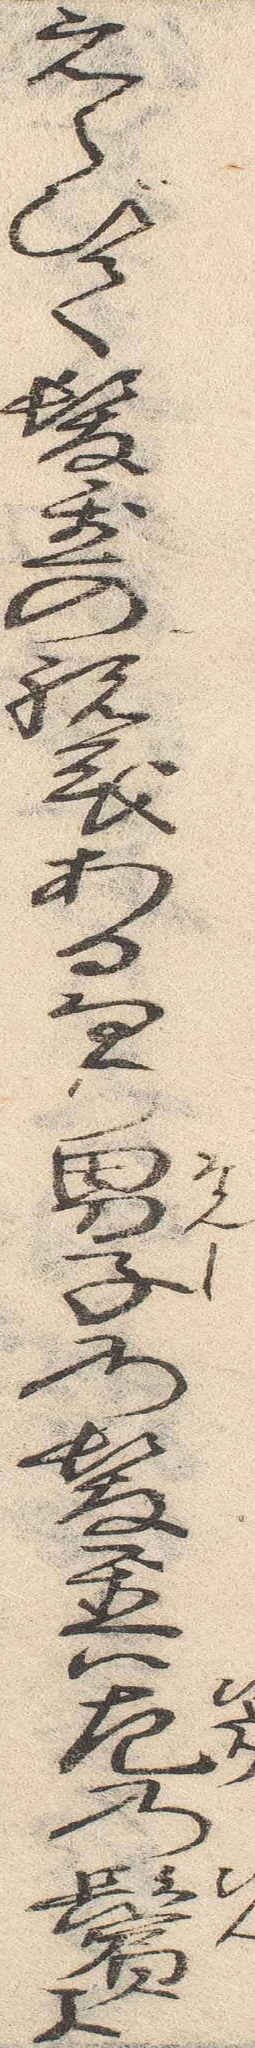えらびて髪置の祝義あるなり男子の髪置は左の鬢よ
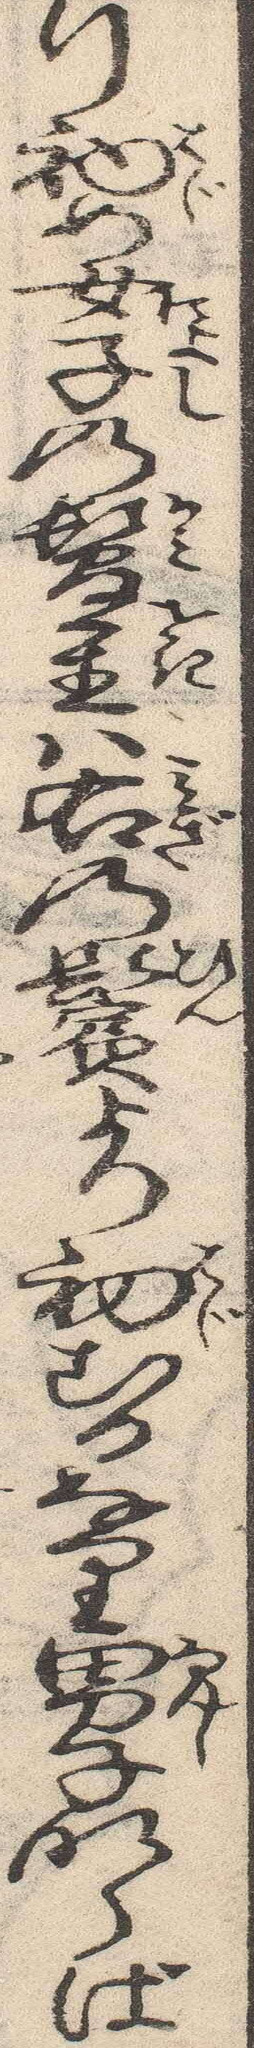り初め女子の髪置は右の鬢より初むるなり男子ならば
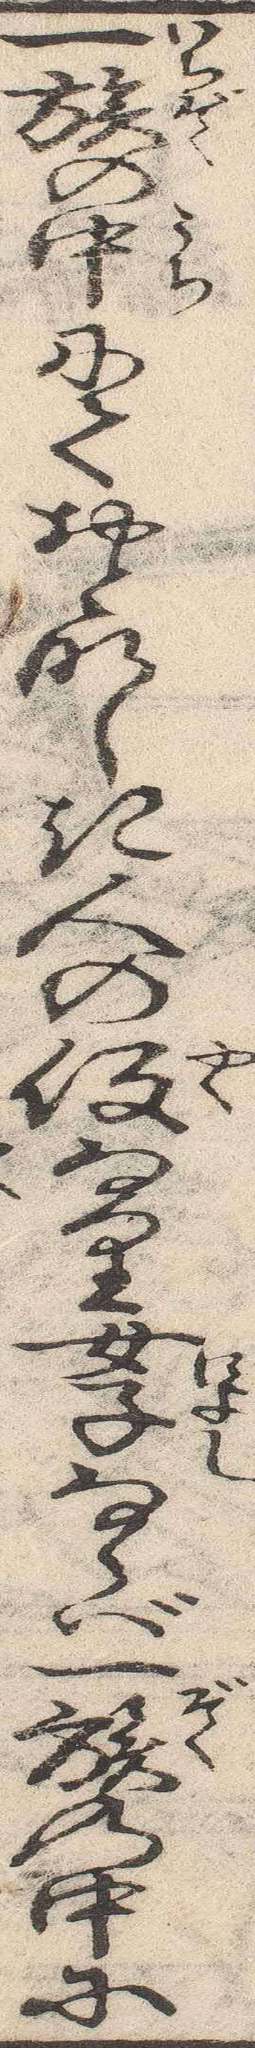一族の中にておとなしき人の役なり女子ならば一族の中に
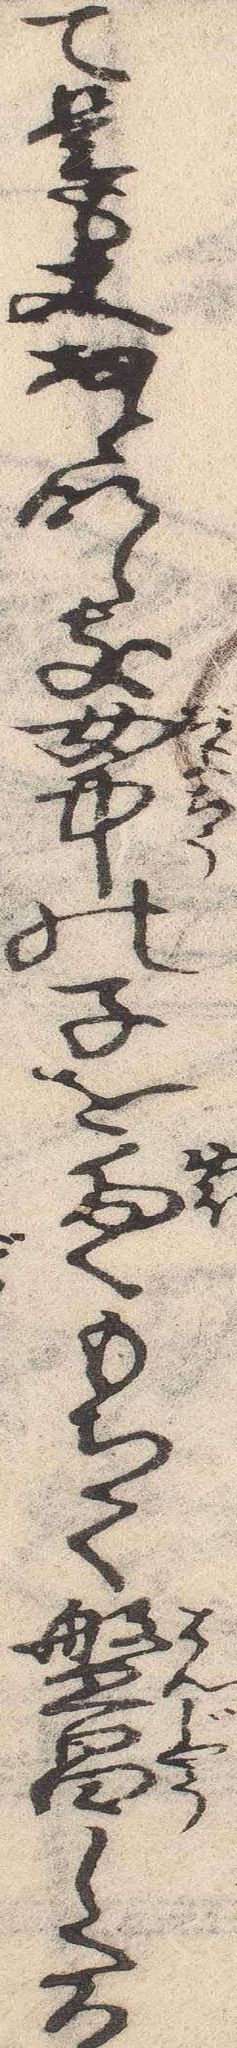て是も又おとなしき女中の子を多くもちて盤昌したる
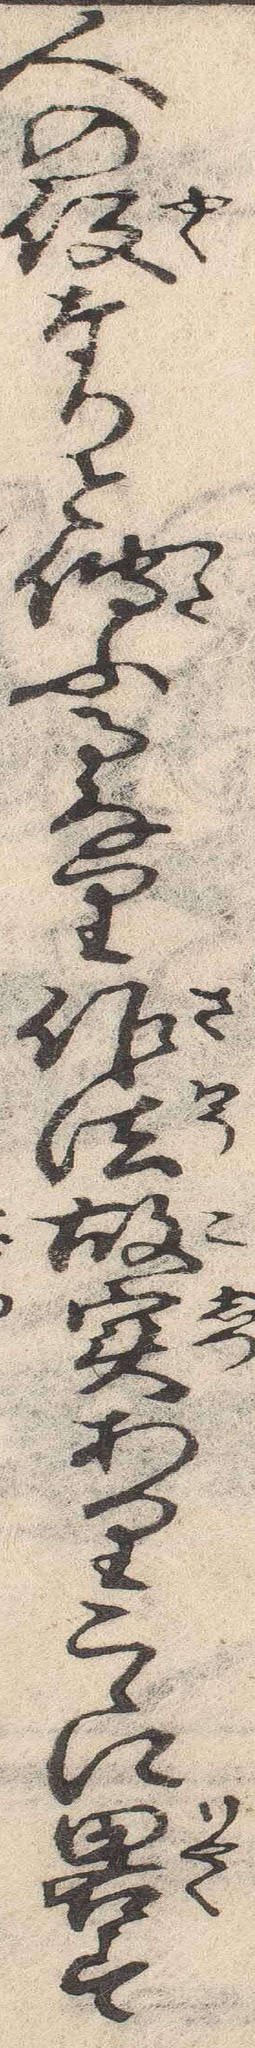人の役なりと傳ふるなり作法故実ありこゝに畧す
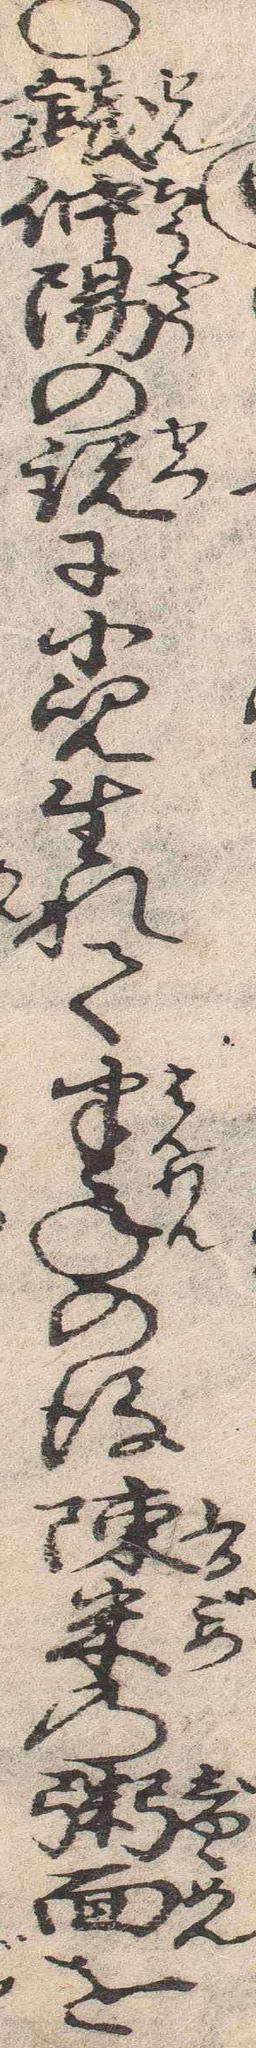◯錢仲陽の説に小児生れて半年の後陳米の粥面を
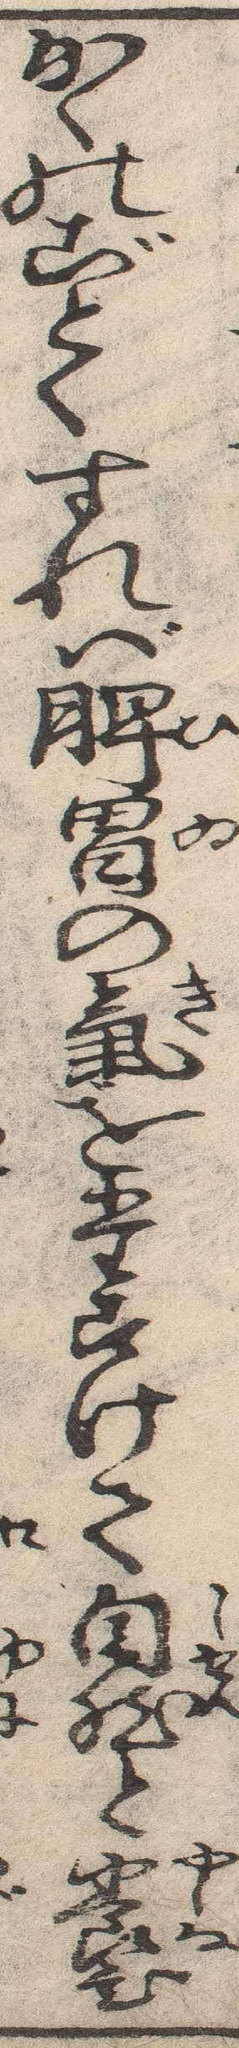かくのごとくすれば脾胃の氣をたすけて自然と養ひ

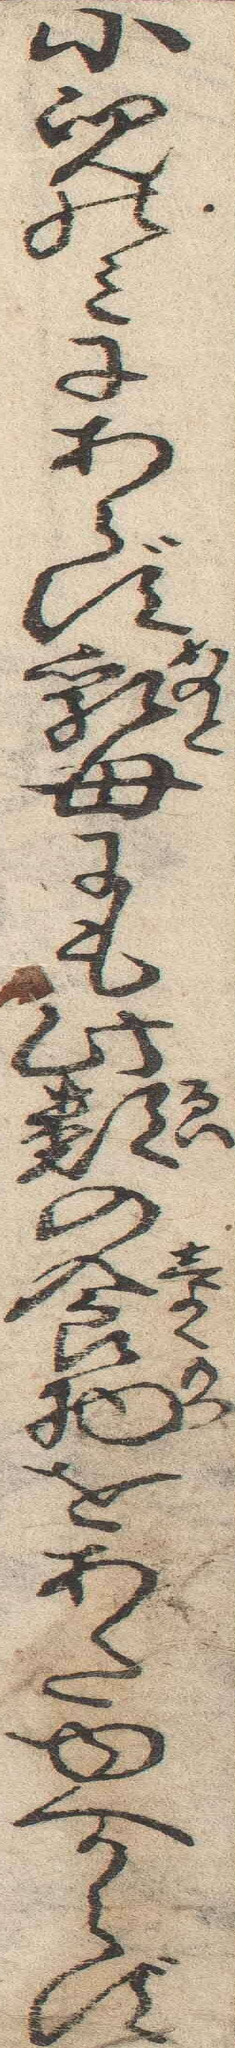小児のみにあらず乳母にも此類の食物をあたゆへからず
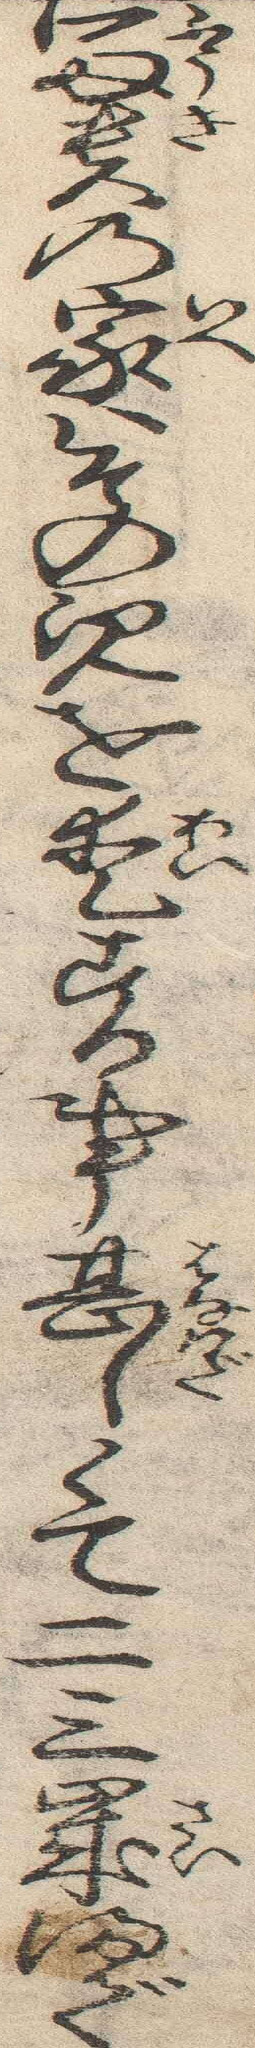富貴の家はその児を愛する事甚しくて二三歳まで
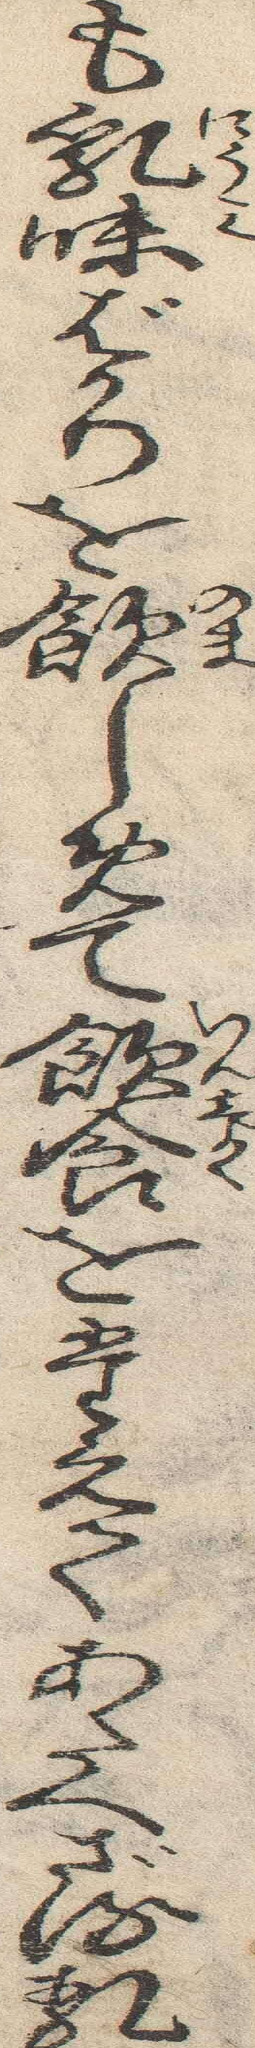も乳味ばかりを飲しめて飲食をたえてあたへざる類
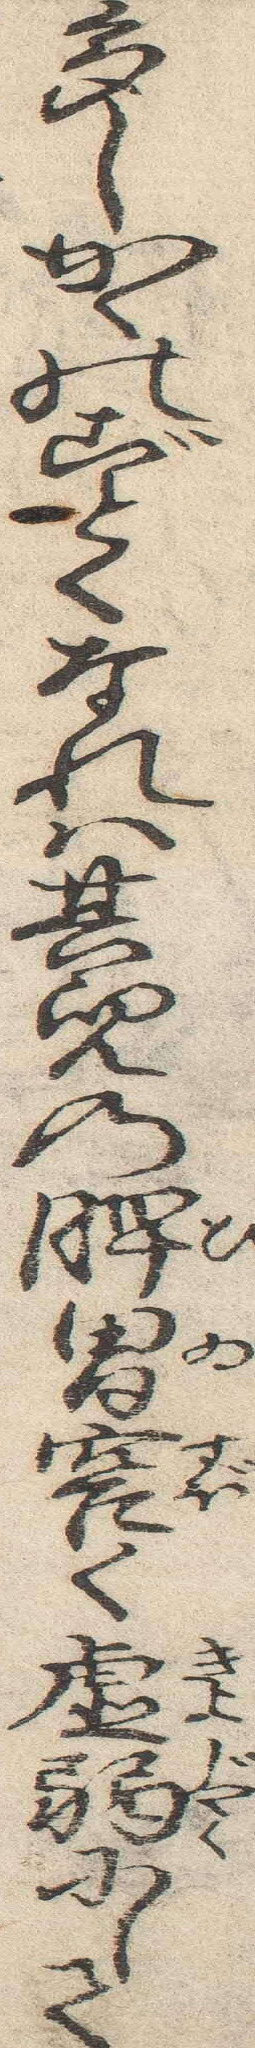多しかくのごとくなれは其児の脾胃窄く虚弱にして
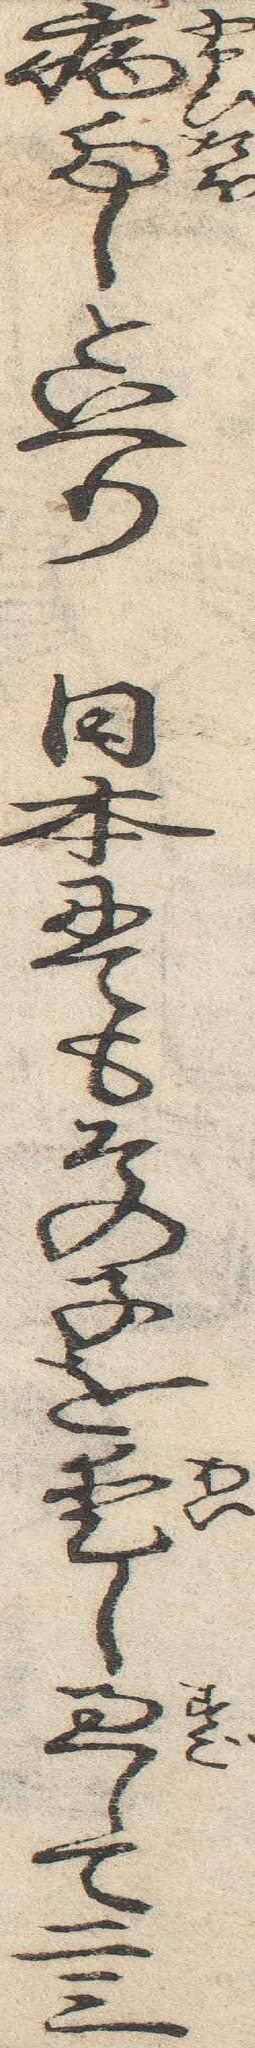病多しといへり日本にてもその子を愛し過して二三
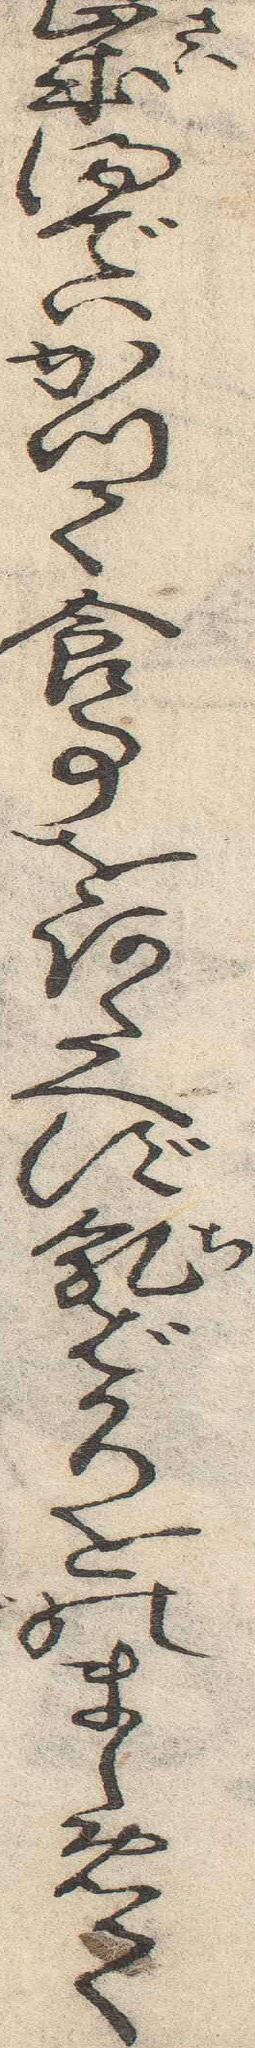歳まではかつて食事をあたへず乳ばかりをのましめて
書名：小児必用養育草
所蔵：東京学芸大学附属図書館 国文学研究資料館
